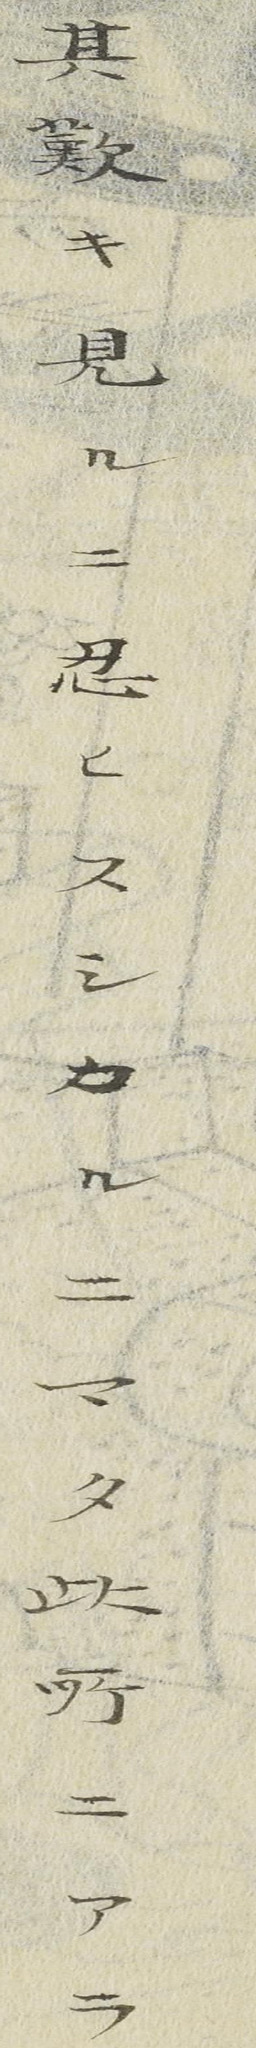其歎キ見ルニ忍ヒスシカルニマタ此所ニアラ
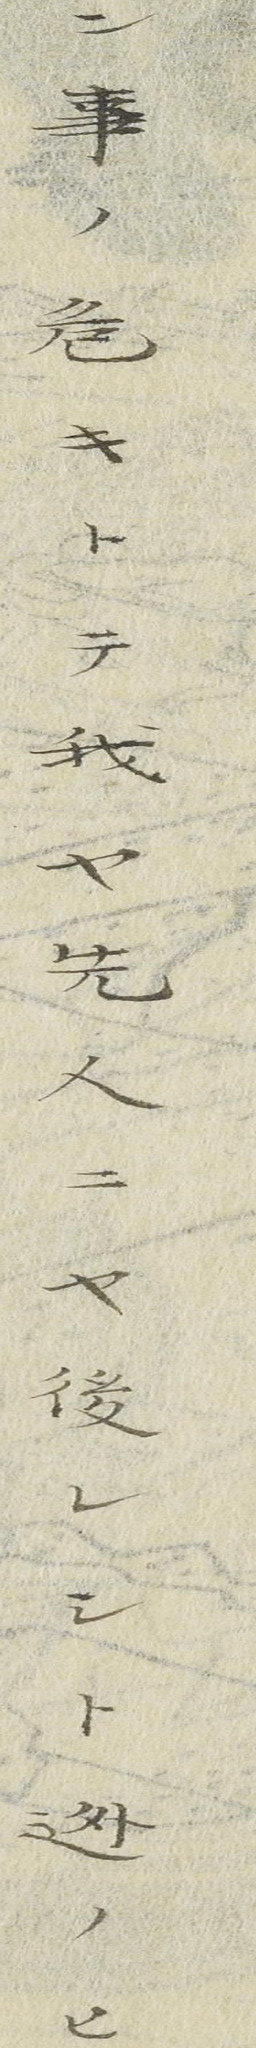ン事ノ危キトテ我ヤ先人ニヤ後レシト迯ノヒ
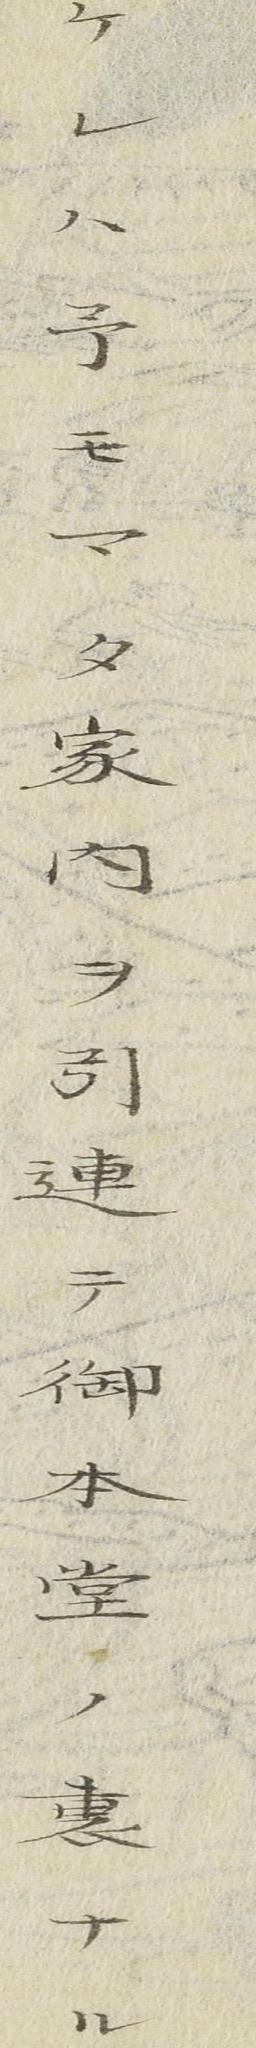ケレハ予モマタ家内ヲ引連テ御本堂ノ裏ナル
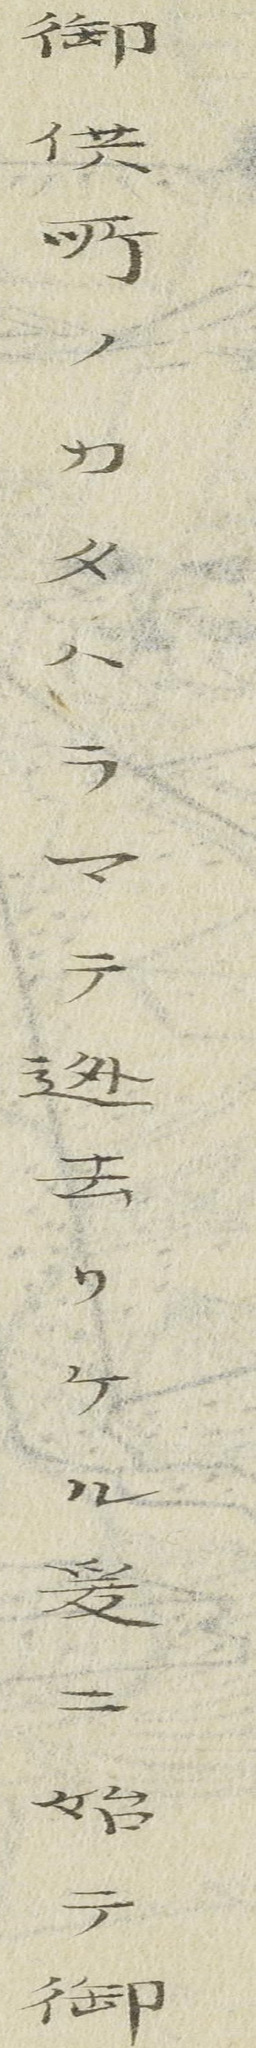御供所ノカタハラマテ迯去リケル爰ニ始テ御
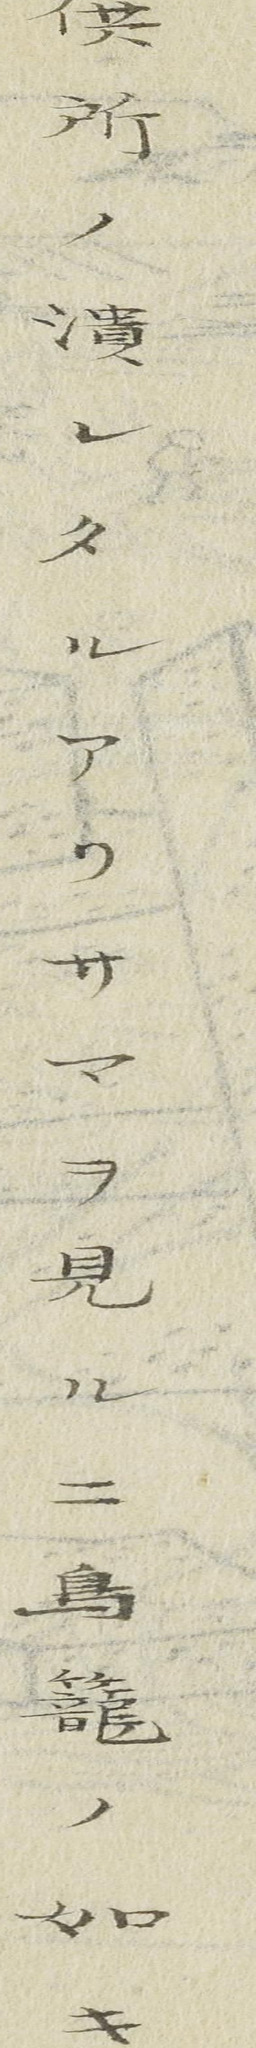供所ノ潰レタルアリサマヲ見ルニ鳥籠ノ如キ
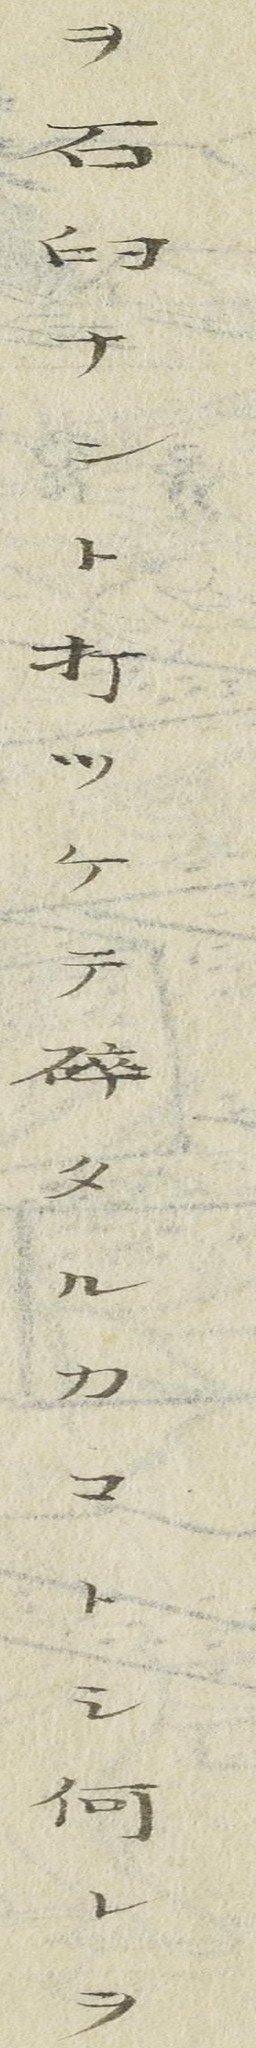ヲ石臼ナント打ツケテ砕タルカコトシ何レヲ
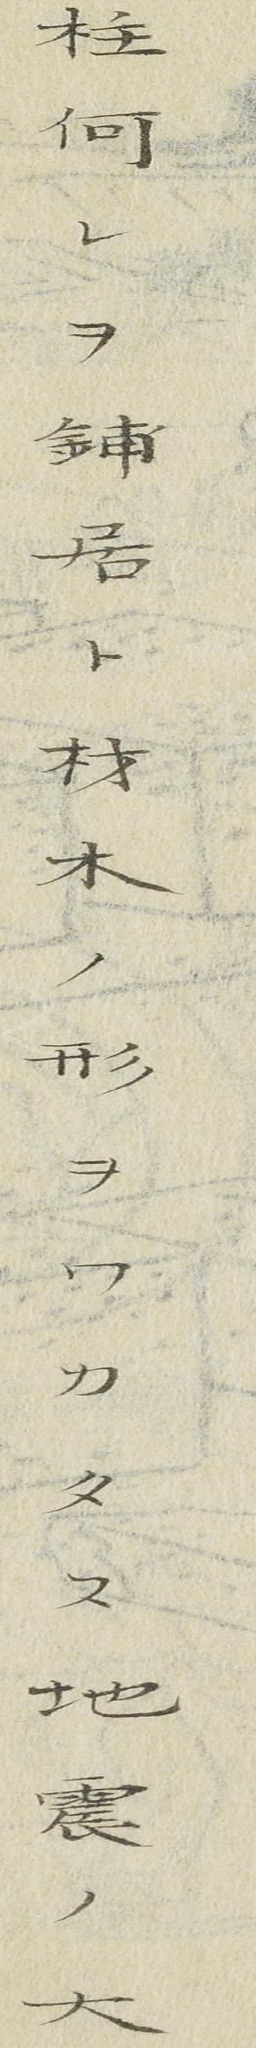柱何レヲ鋪居ト材木ノ形ヲワカタス地震ノ大
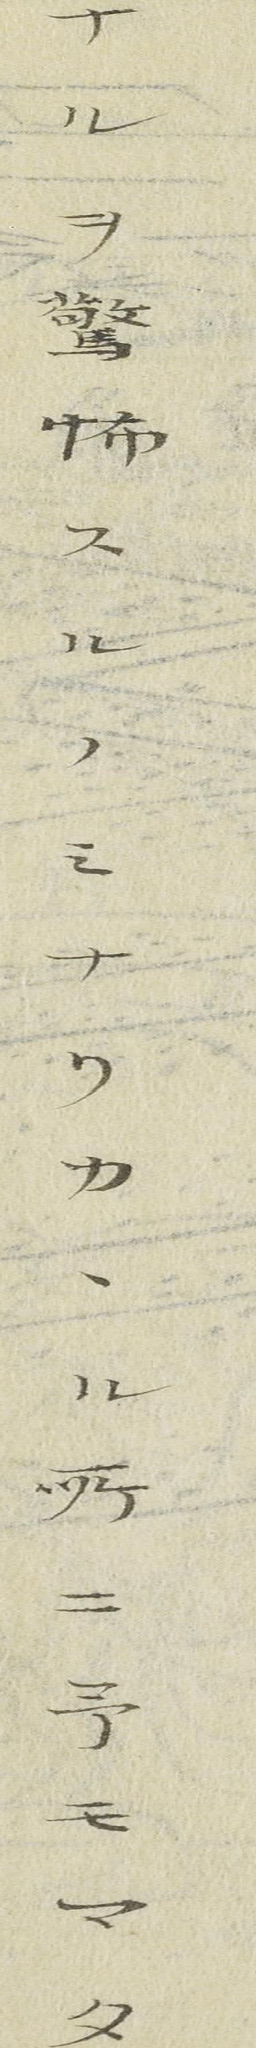ナルヲ驚怖スルノミナリカヽル所ニ予モマタ
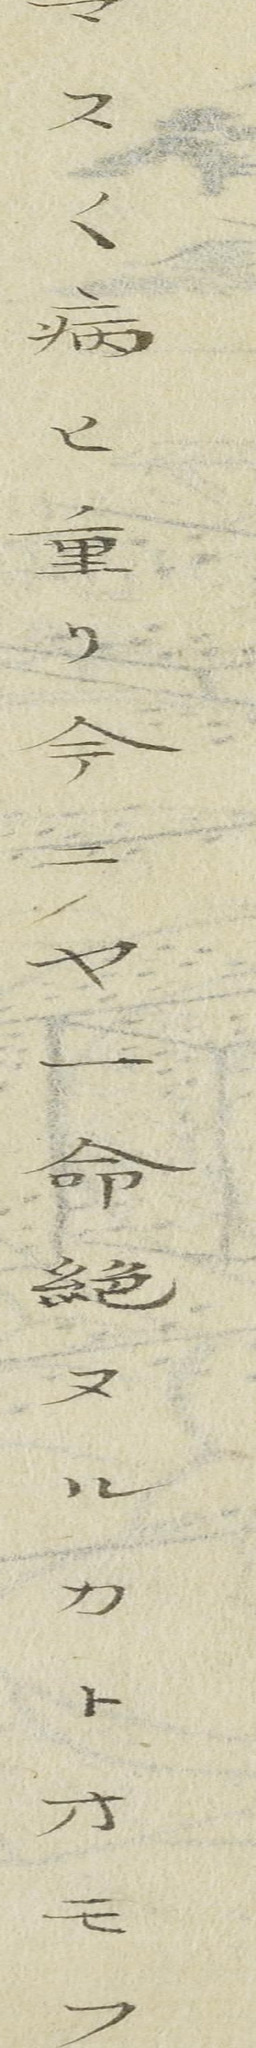マス〱病ヒ重リ今ニヤ一命絶ヌルカトオモフ

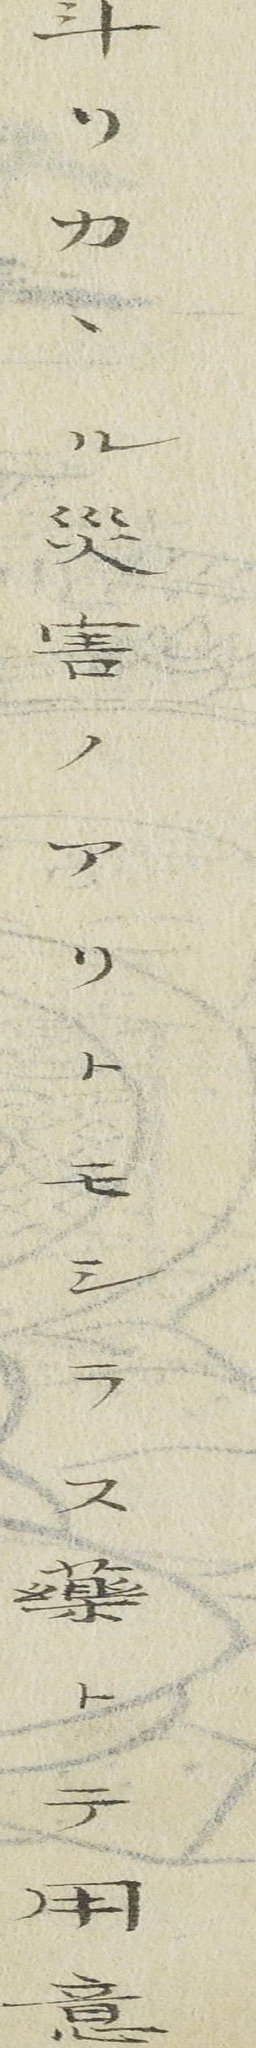斗リカヽル災害ノアリトモシラス薬トテ用意
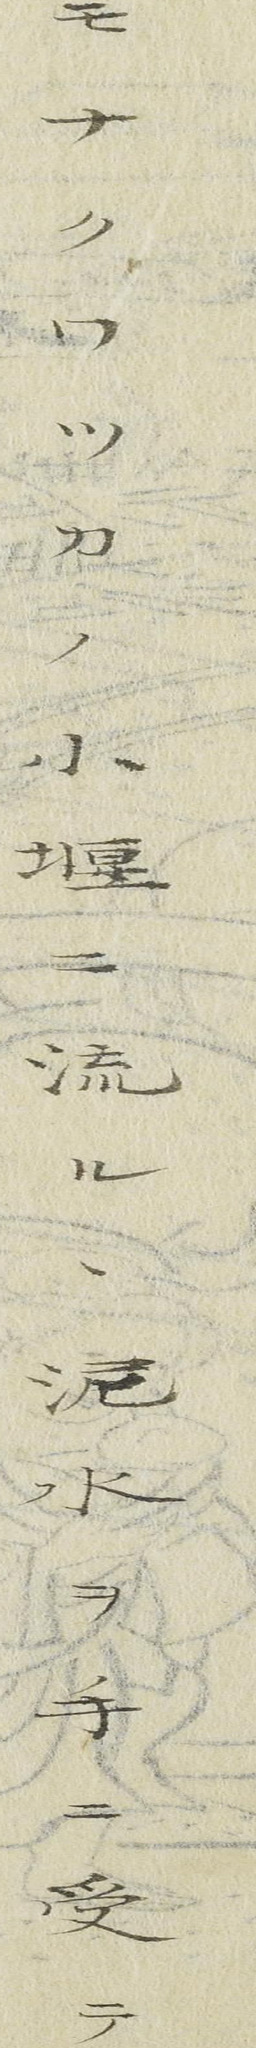モナクワツカノ小堰ニ流ルヽ泥水ヲ手ニ受テ
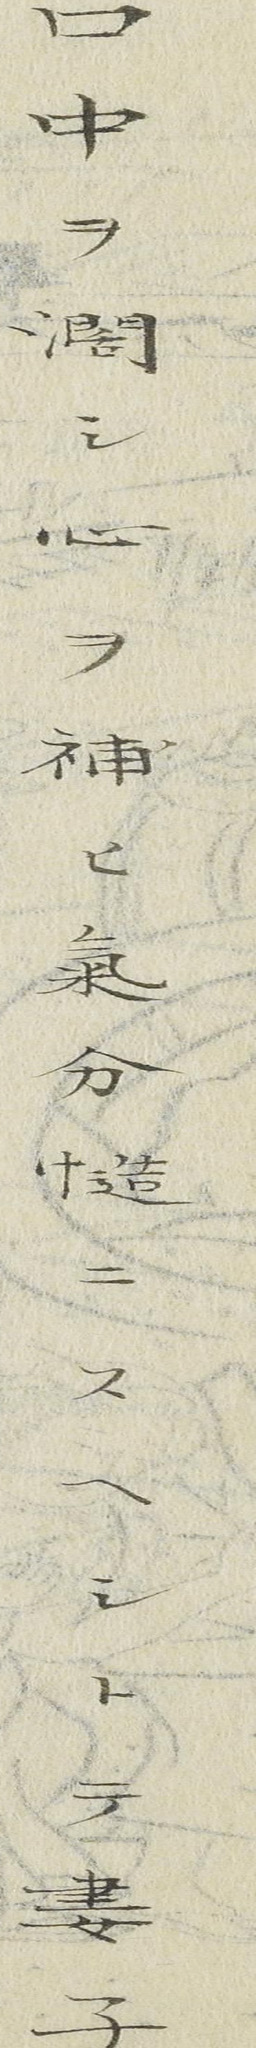口中ヲ潤シ心ヲ補ヒ気分慥ニスヘシトテ妻子
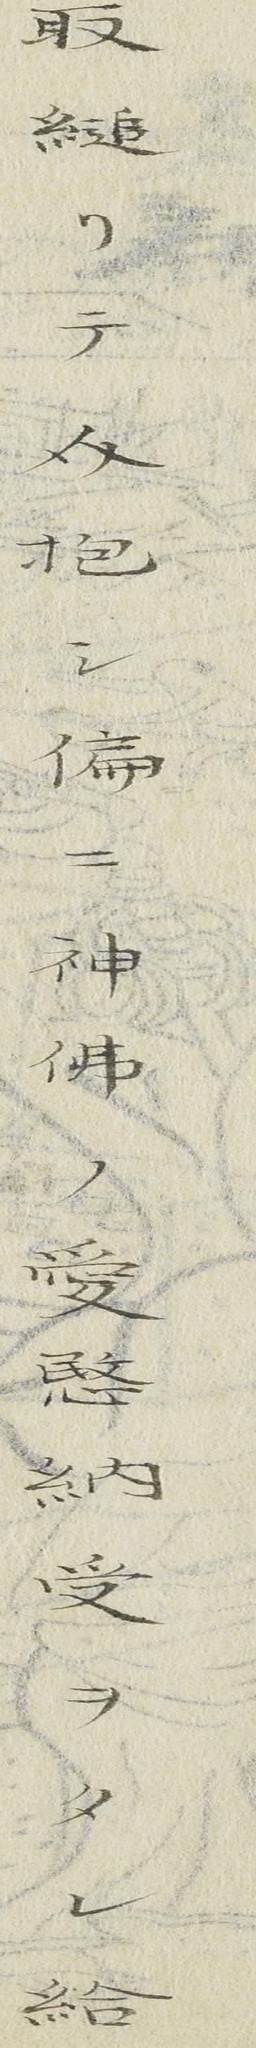取縋リテ介抱シ偏ニ神仏ノ愛愍納受ヲタレ給
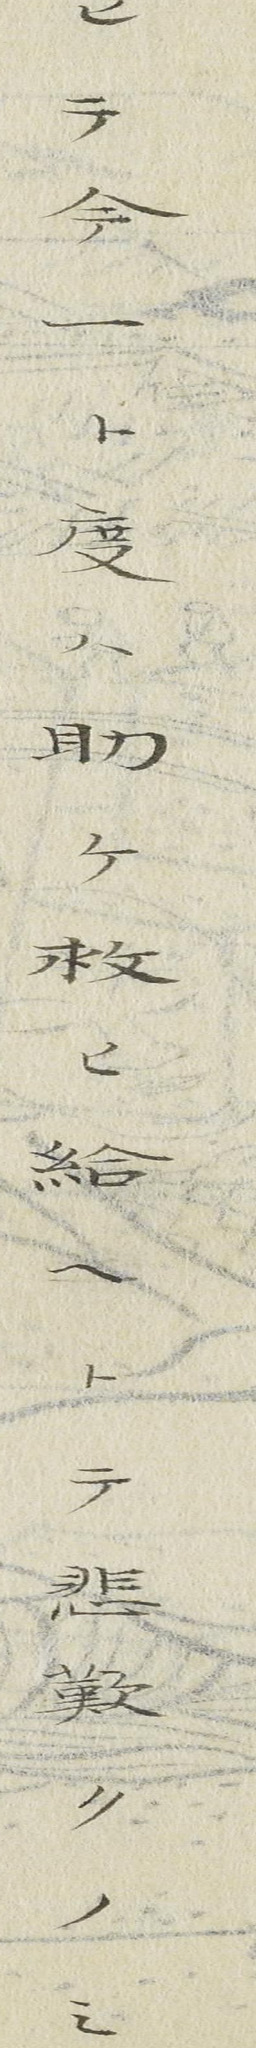ヒテ今一ト度ハ助ケ救ヒ給ヘトテ悲歎クノミ
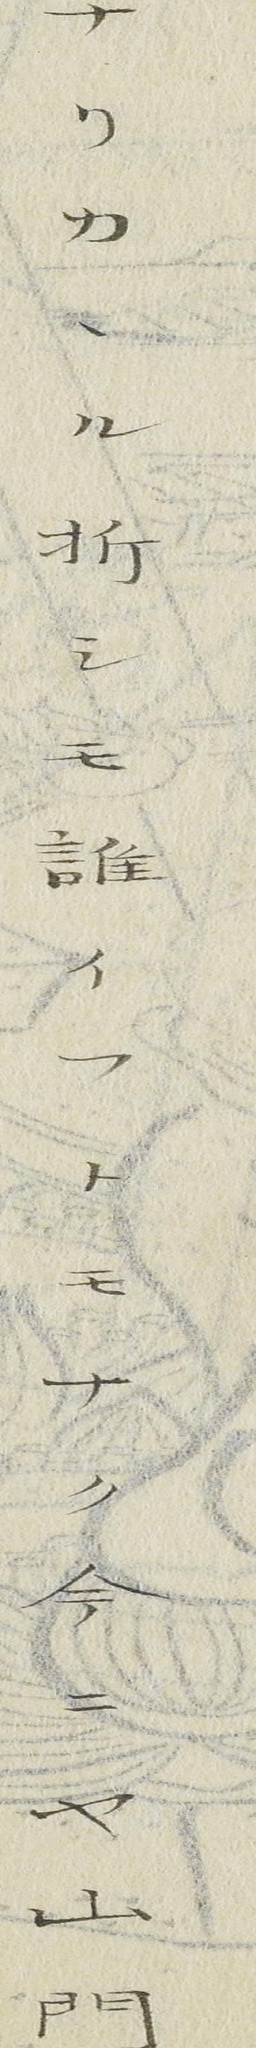ナリカヽル折シモ誰イフトモナク今ニヤ山門
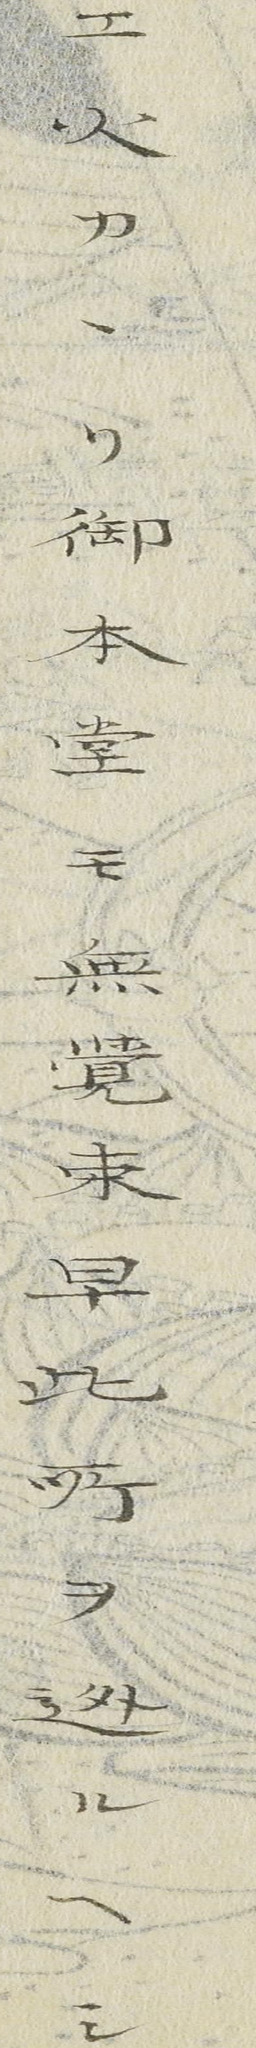エ火カヽリ御本堂モ無覚束早此所ヲ迯ルヘシ
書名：地災撮要　地震之部　巻ノ二
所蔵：東京大学地震研究所図書室 Earthquake Research Institute Library, The University of Tokyo, JAPAN
